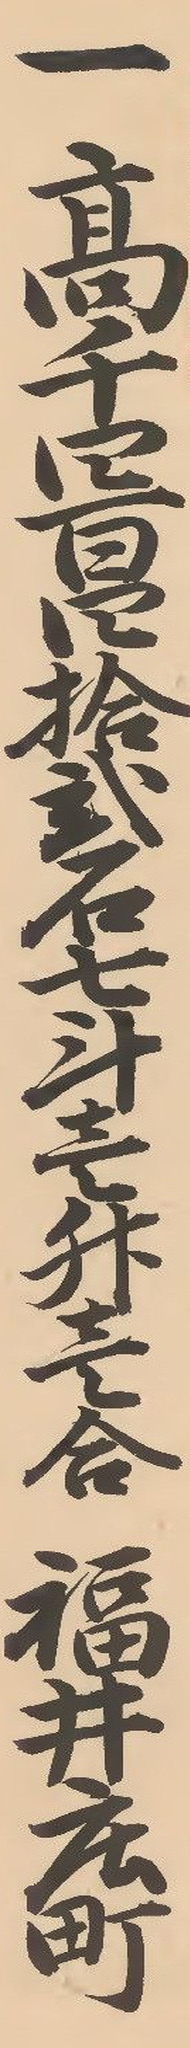一高千四百拾弐石七斗壱升壱合福井庄町
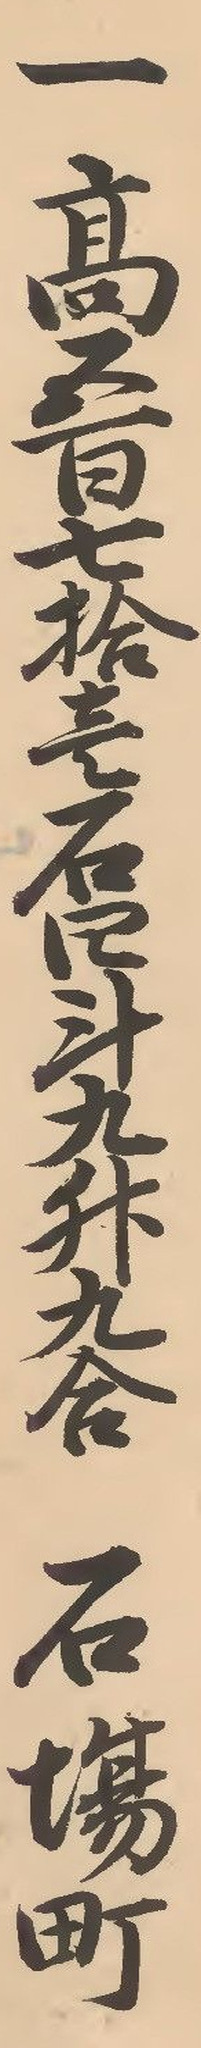一高五百七拾壱石四斗九升九合石場町

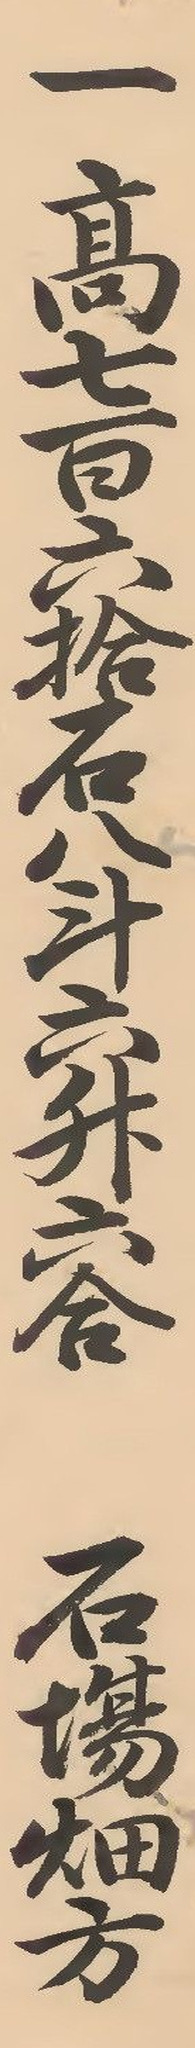一高七百六拾石八斗六升六合石場畑方
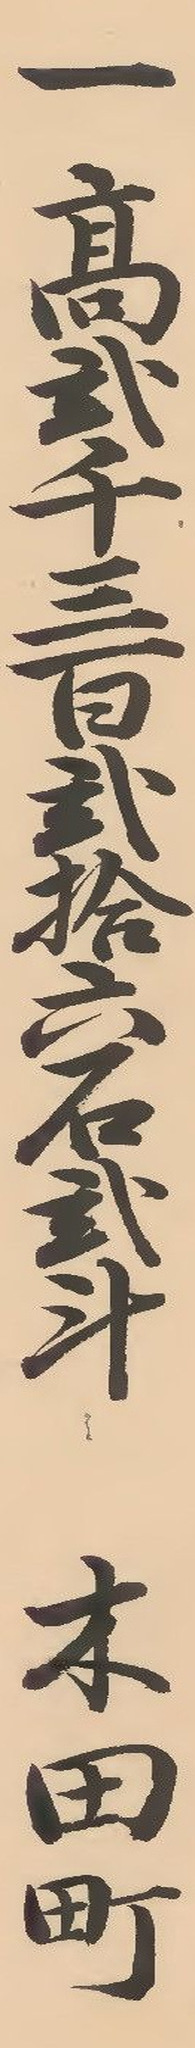一高弐千三百弐拾六石弐斗木田町
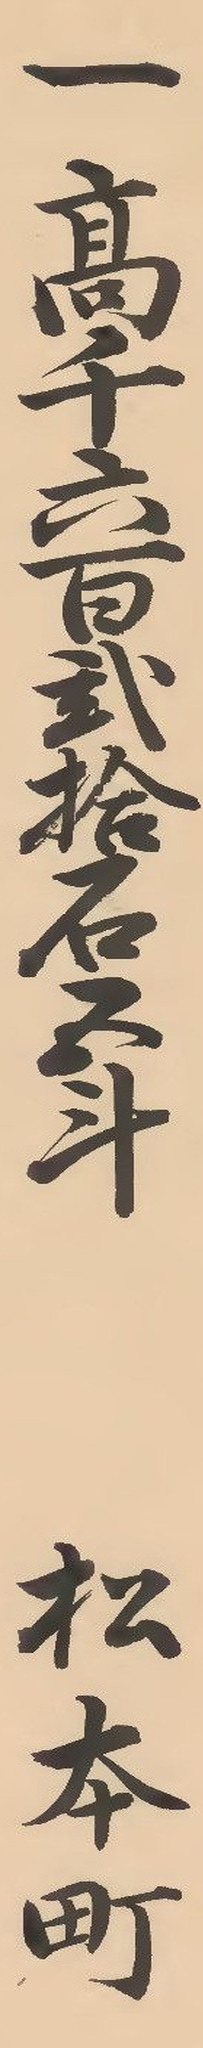一高千六百弐拾石五斗松本町
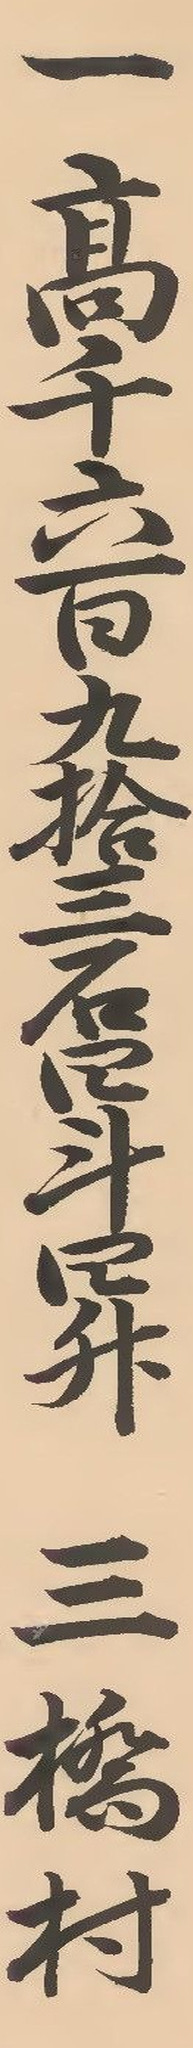一高千六百九拾三石四斗四升三橋村
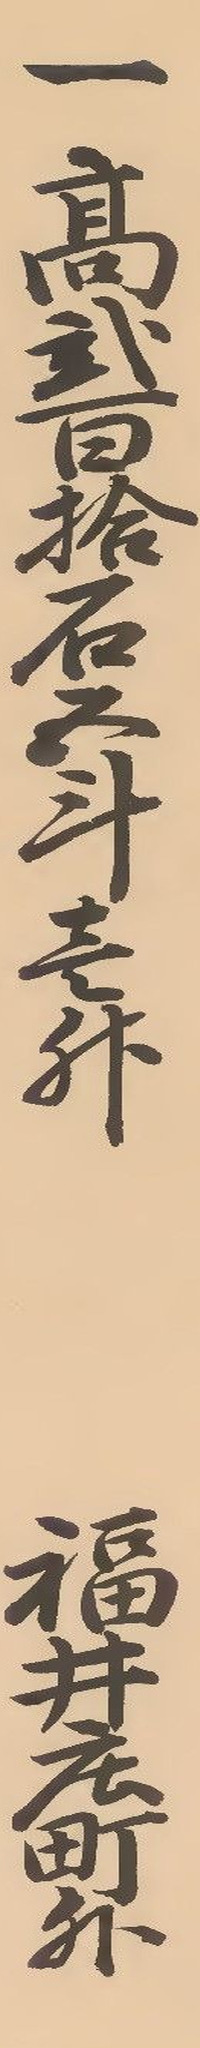一高弐百拾石五斗壱升福井庄町外
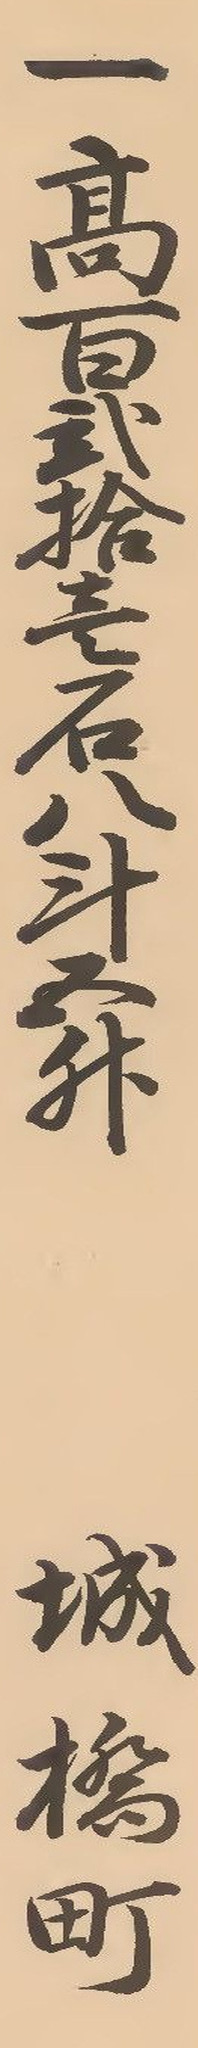一高百弐拾壱石八斗五升城橋町
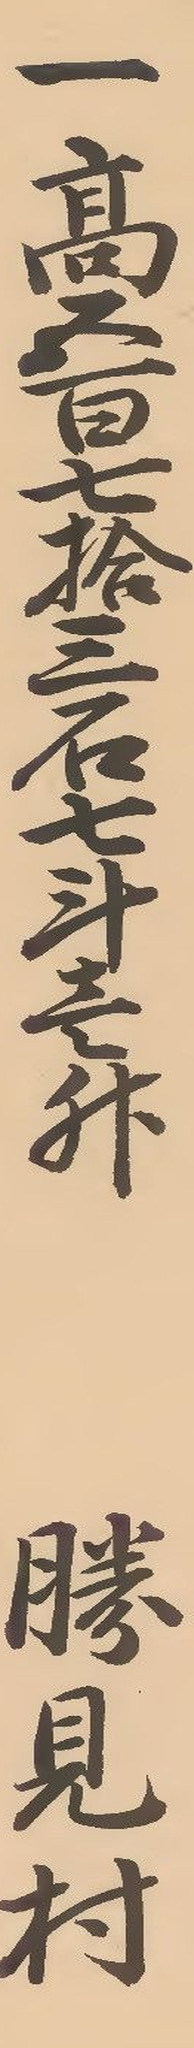一高五百七拾三石七斗壱升勝見村
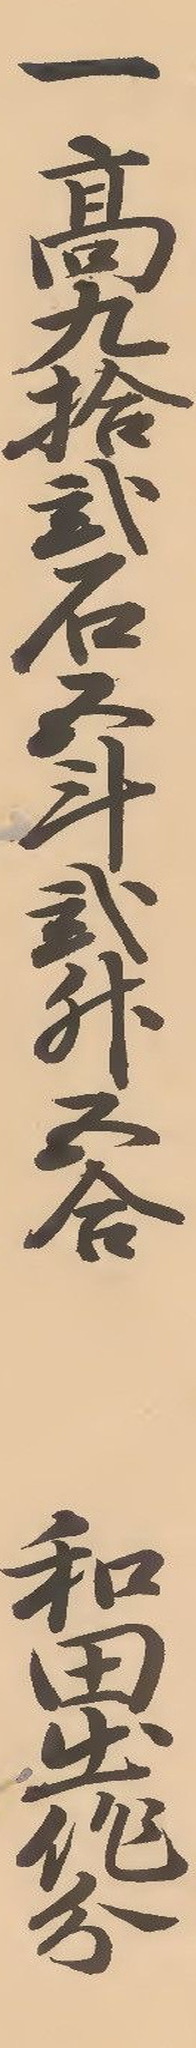一高九拾弐石五斗弐升五合和田出作分

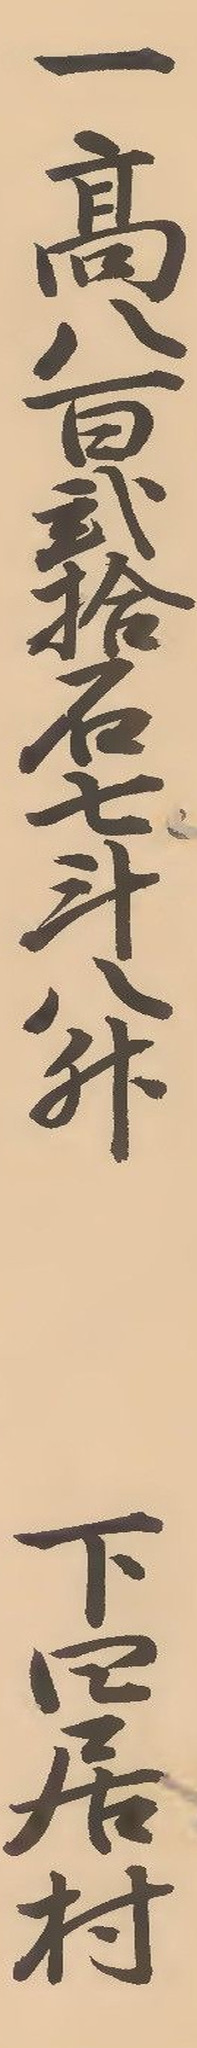一高八百弐拾石七斗八升下四居村
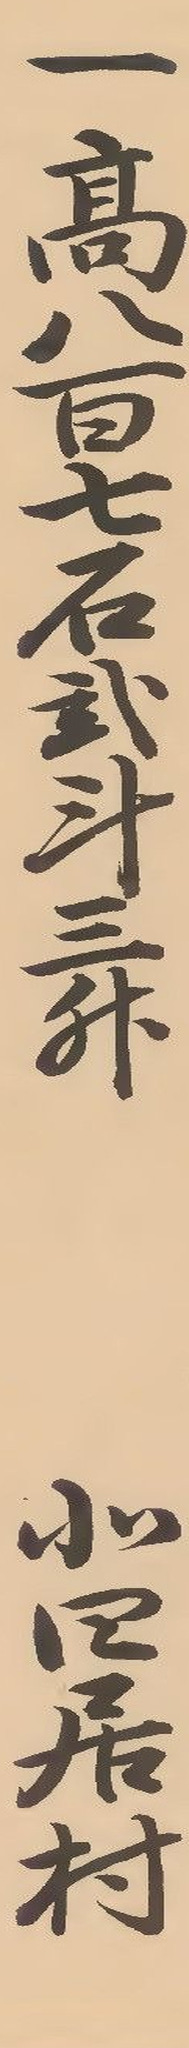一高八百七石弐斗三升北四居村
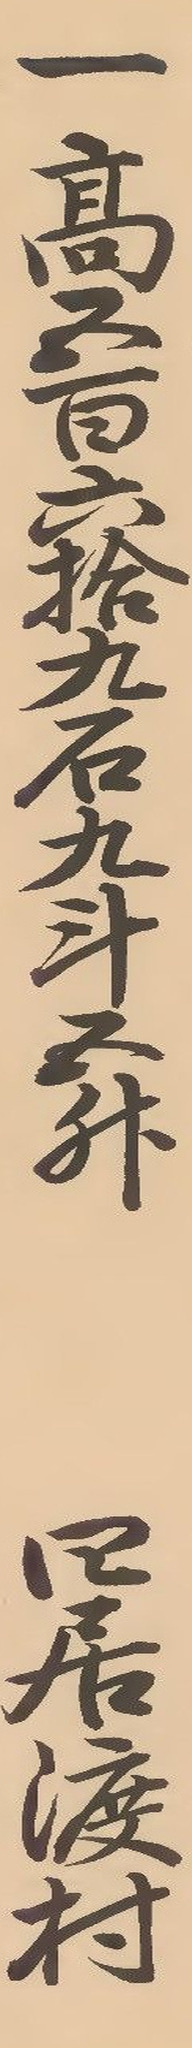一高五百六拾九石九斗五升四居渡村
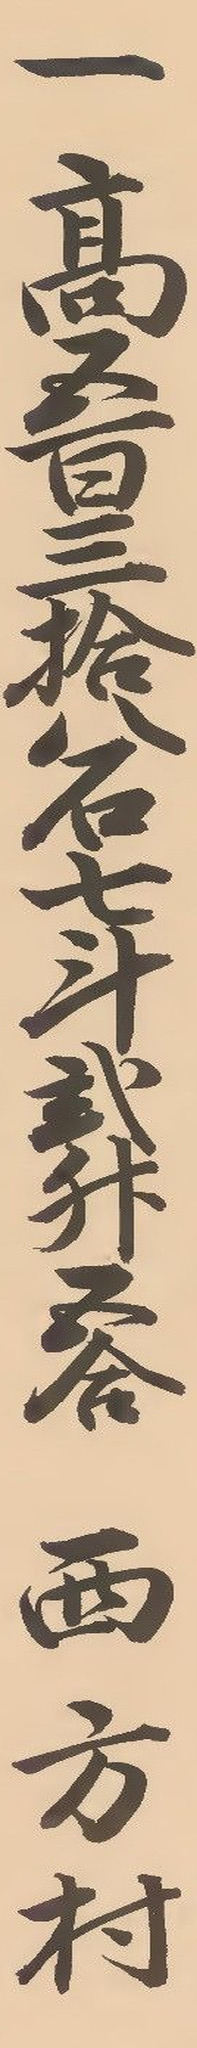一高五百三拾八石七斗弐升五合西方村
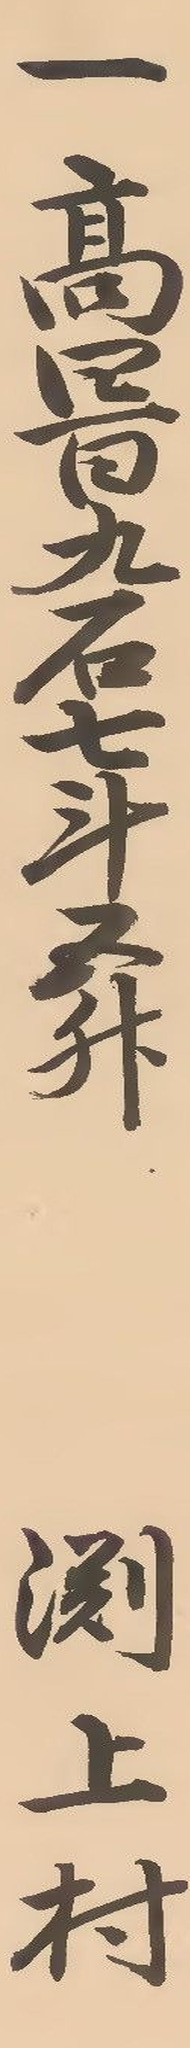一高四百九石七斗五升渕上村
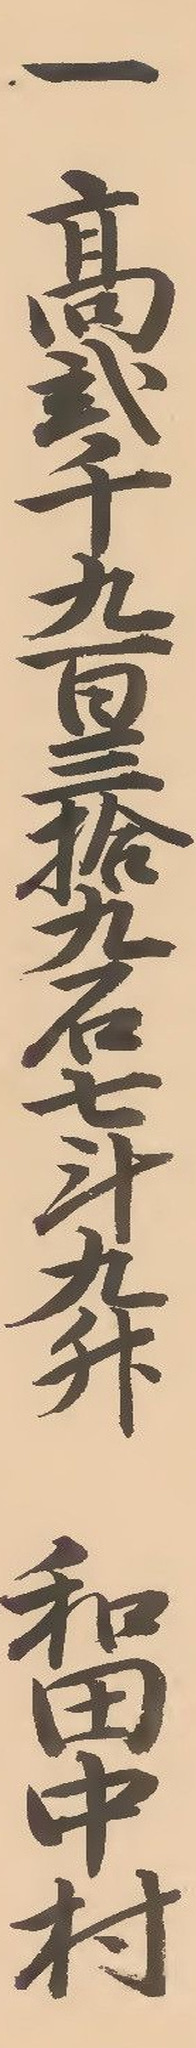一高弐千九百三拾九石七斗九升和田中村
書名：越前国郷帳
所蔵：国立公文書館 National Archives of Japan
